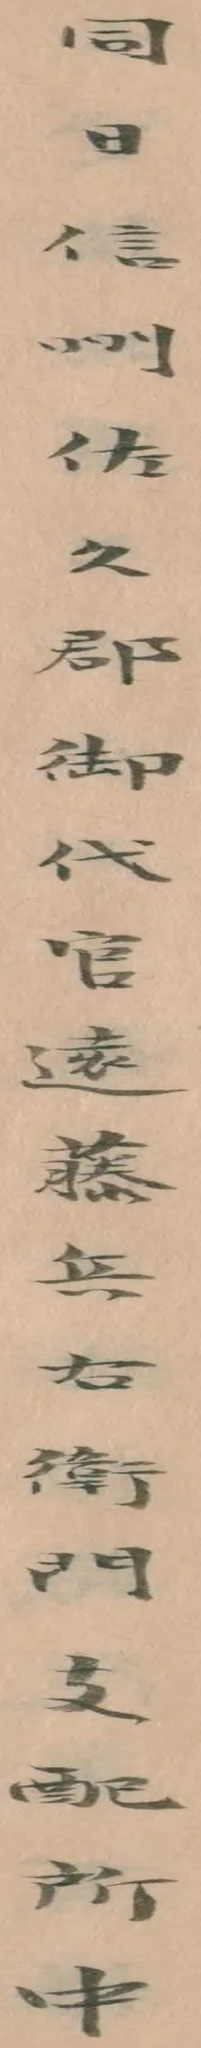同日信州佐久郡御代官遠藤兵右衛門支配所中
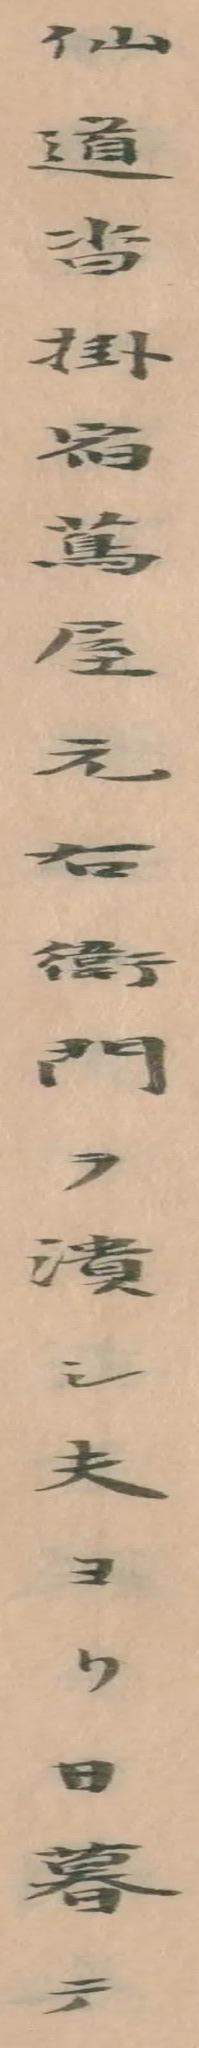山道沓掛宿蔦屋元右衛門ヲ潰シ夫ヨリ日暮テ
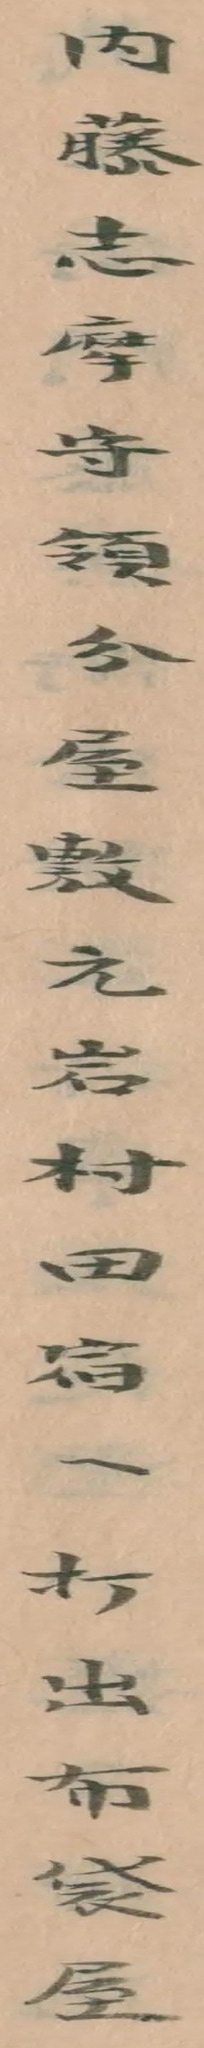内藤志摩守領分屋敷元岩村田宿へ打出布袋屋

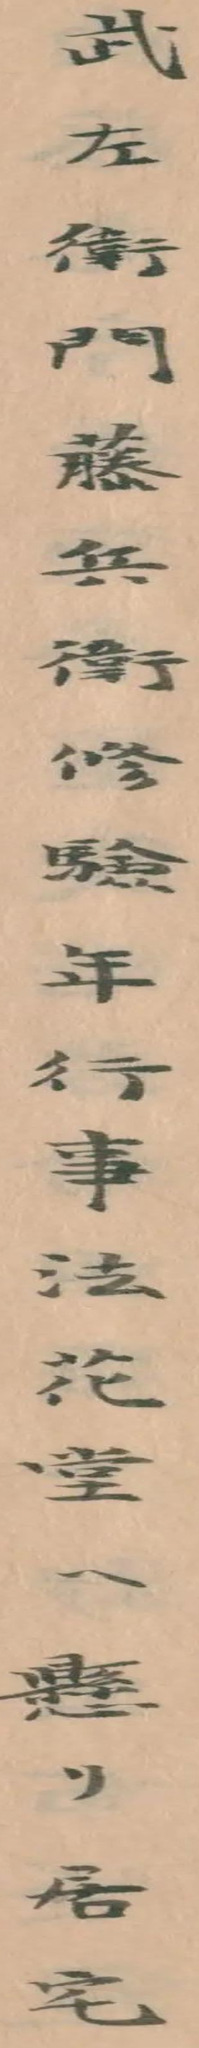武左衛門籐兵衛修験年行事法花堂へ懸リ居宅
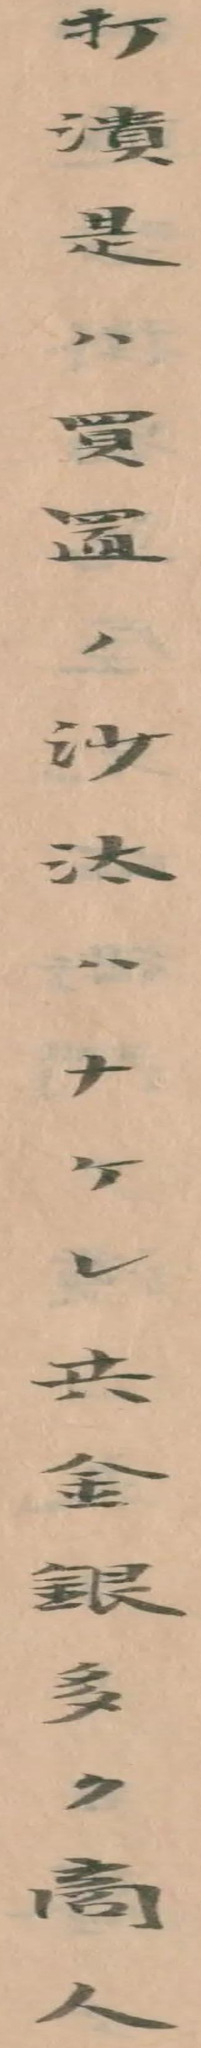打潰是ハ買置ノ沙汰ハナケレ共金銀多ク商人
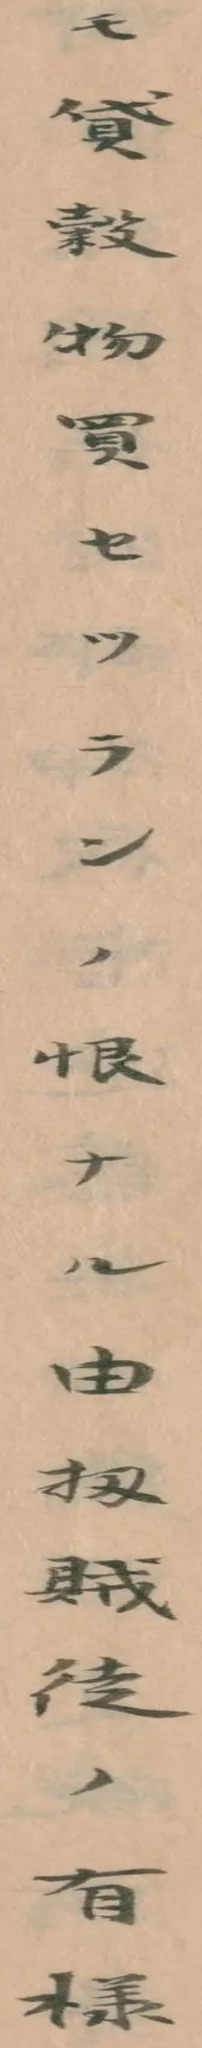モ貸穀物買セツランノ恨ナル由扨賊徒ノ有様
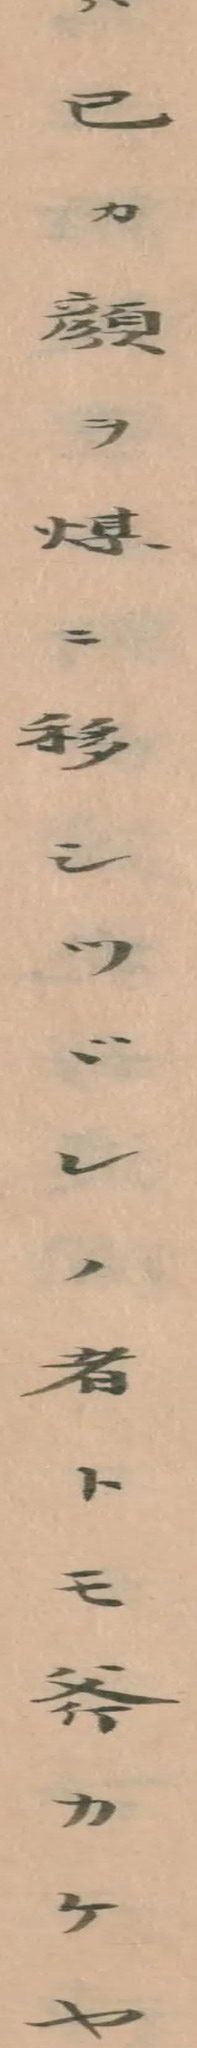ハ己ヵ顔ヲ煤二移シツゞレノ者トモ斧カケヤ
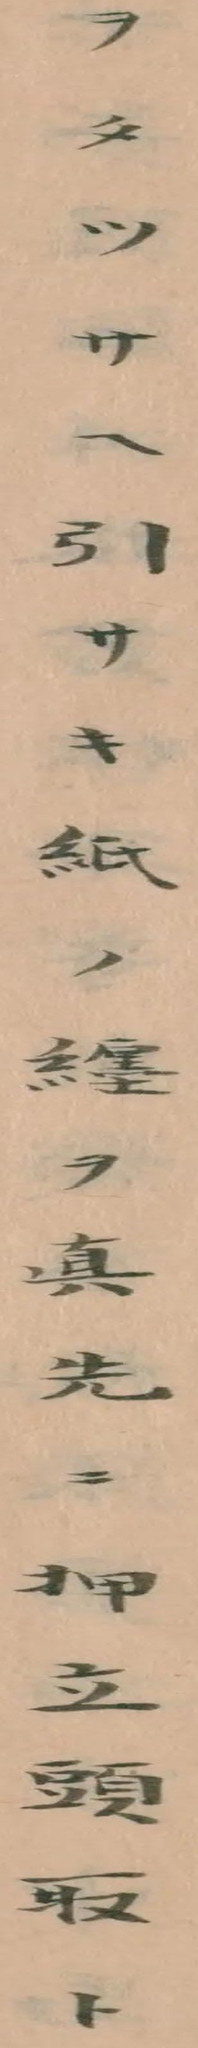ヲタツサへ引サキ紙ノ纏ヲ真先二押立頭取ト
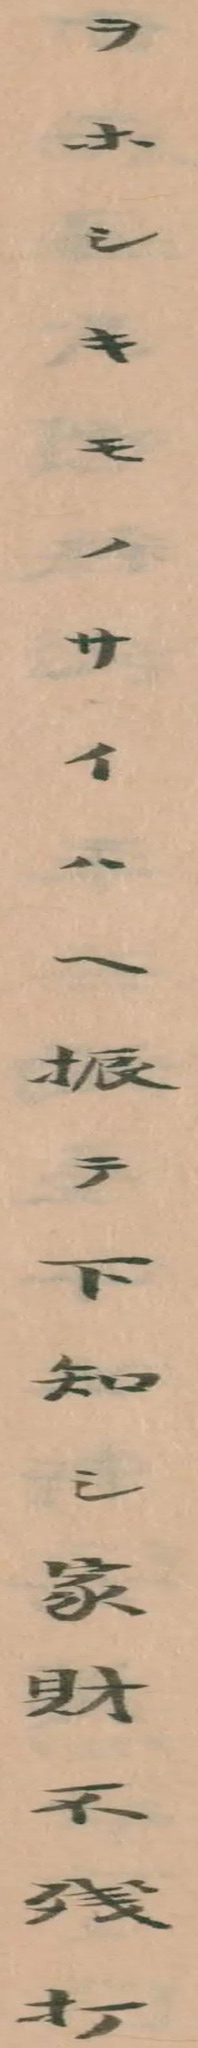ヲホシキモノサイハイ振テ下知シ家財不残打
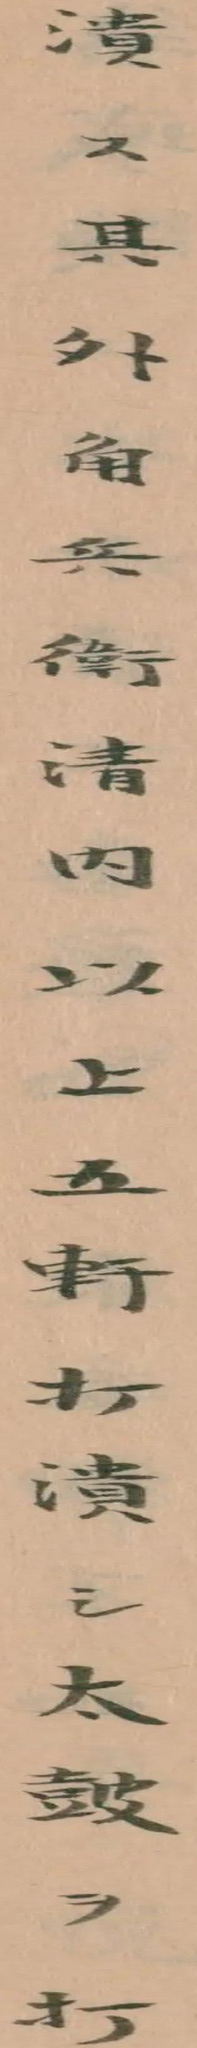潰ス其外角兵衛清内以上五軒打潰シ太鼓ヲ打
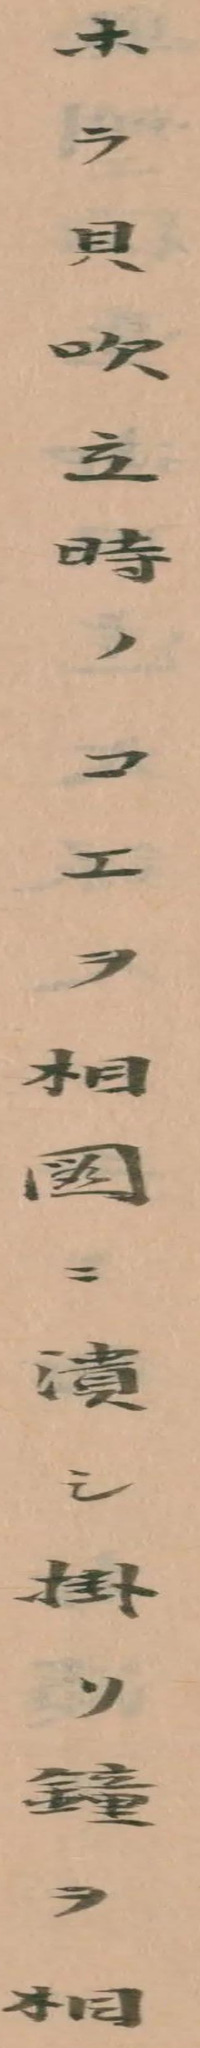ホラ貝吹立時ノコエヲ相図二潰シ掛リ鐘ヲ相
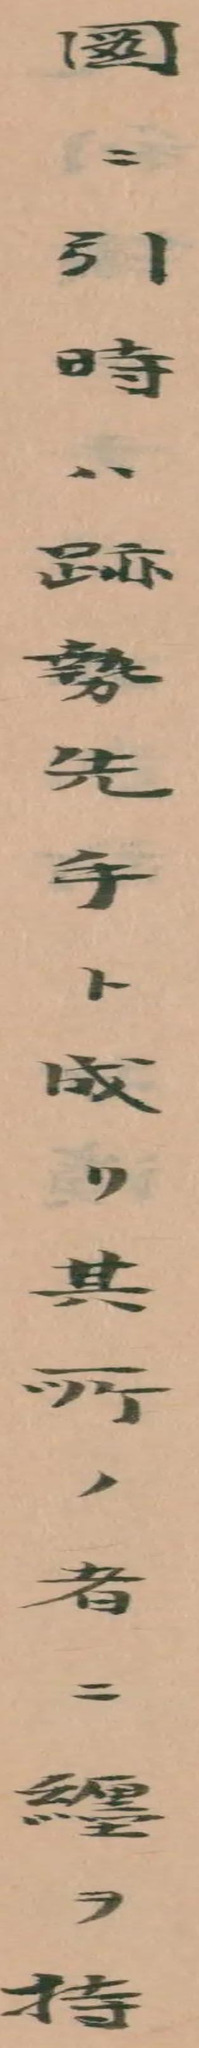図二引時ハ跡勢先手ト成り其所ノ者二纏ヲ持
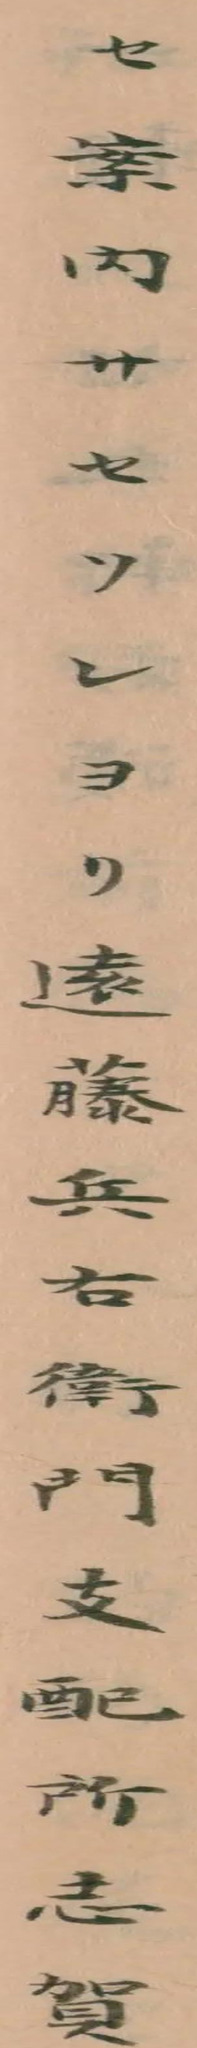セ案内サセソレヨリ遠藤兵右衛門支配所志賀
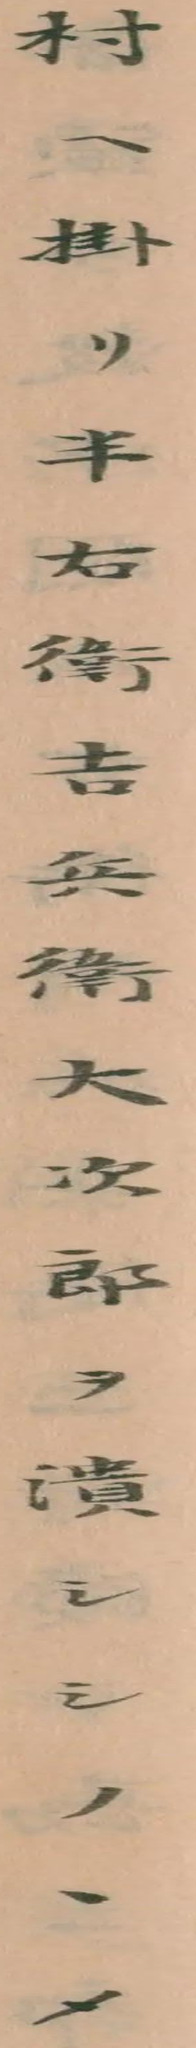村へ掛リ平右衛吉兵衛大次郎ヲ潰シシノゝメ
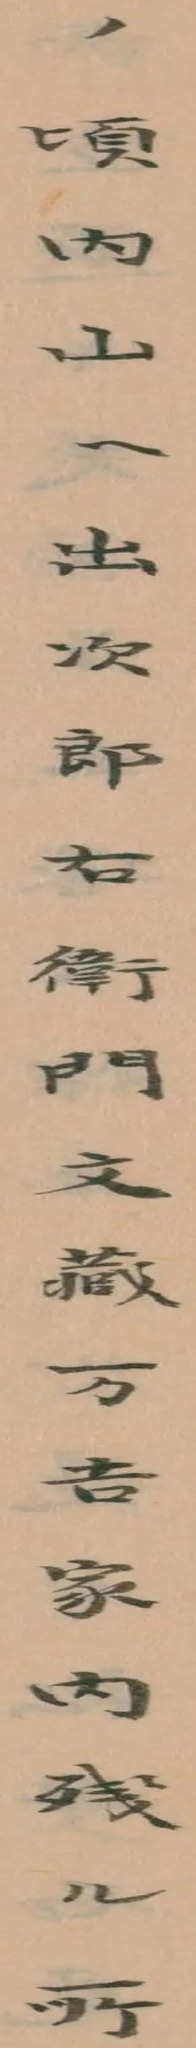ノ頃内山へ出次郎右衛門文蔵万吉家内残ル所
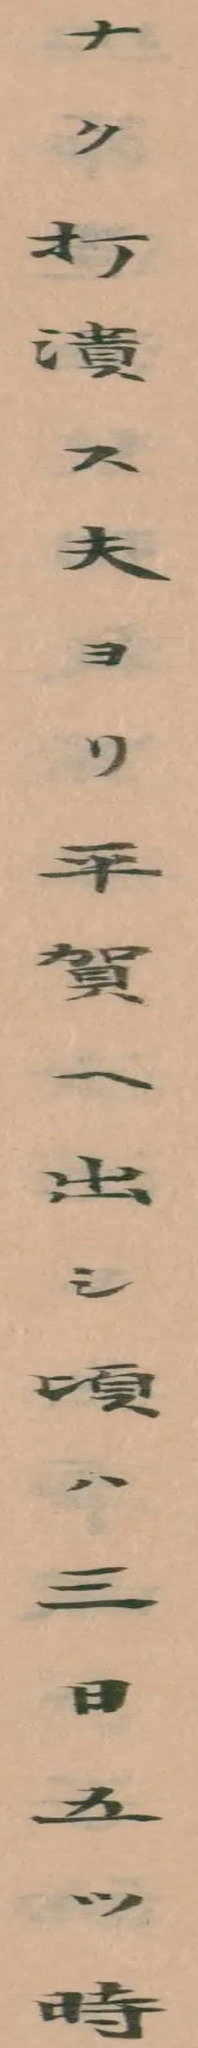ナク打潰ス夫ヨリ平賀へ出シ頃ハ三日五ッ時
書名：地災撮要. 巻3(地震之部)-巻4(噴火之部)
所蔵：国立国会図書館 National Diet Library, JAPAN
